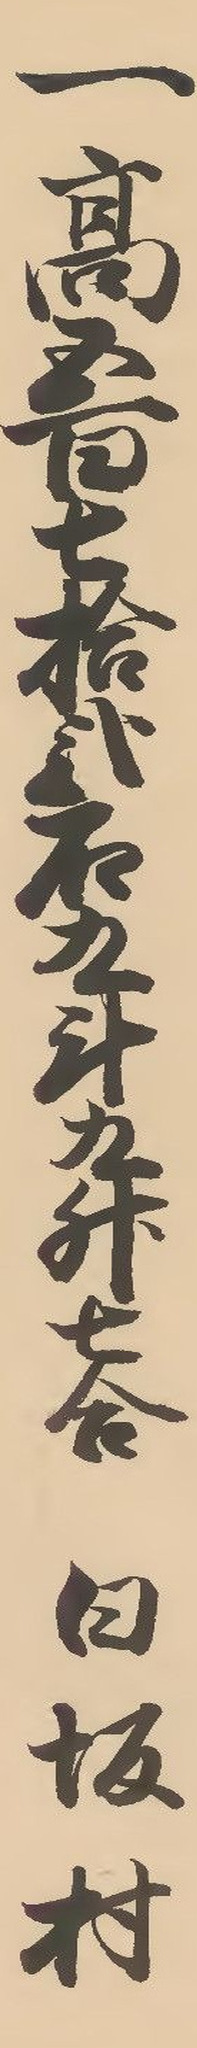一高五百七拾弐石九斗九升七合白坂村
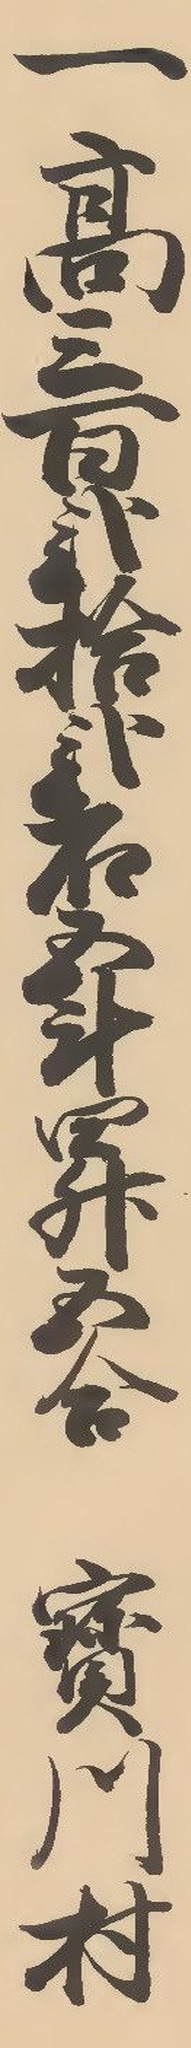一高三百弐拾弐石五斗四升五合宝川村
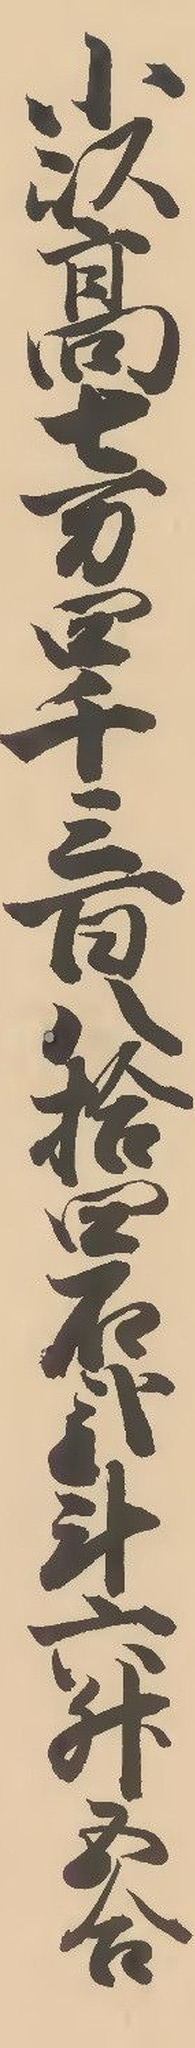小以高七万四千三百八拾四石弐斗六升五合
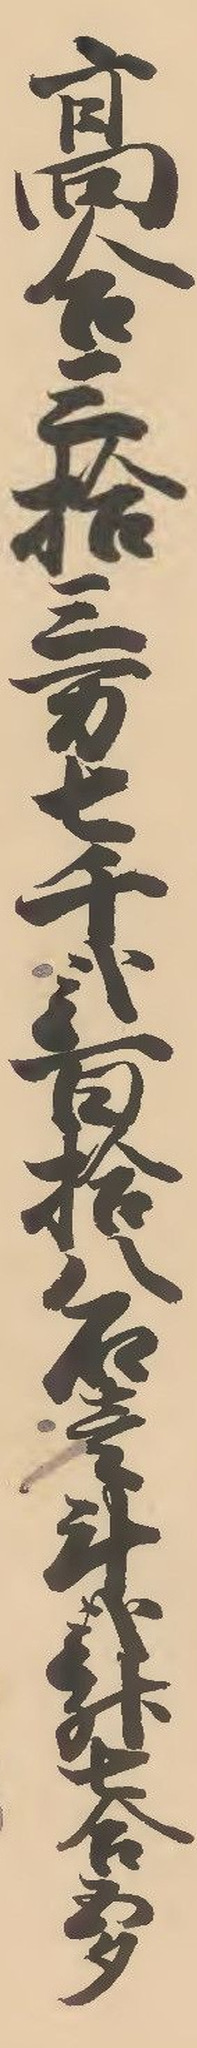高合三拾三万七千弐百拾八石壱斗弐升七合五勺

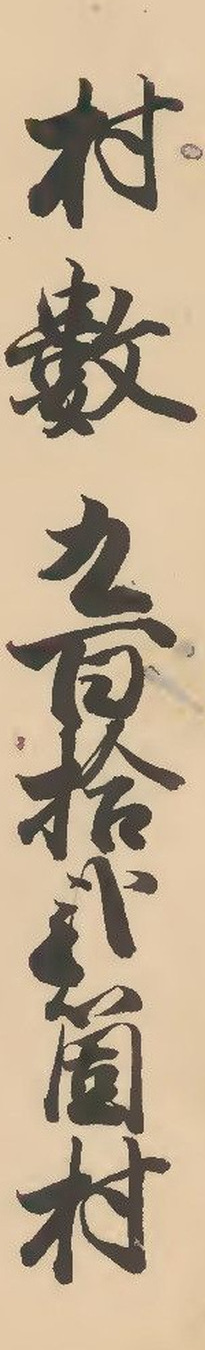村数五百拾弐箇村
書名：陸奥国郷帳　１
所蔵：国立公文書館 National Archives of Japan
